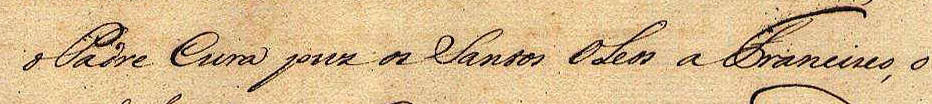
o Padre Cura puz os Santos OLeos a Francisco, o
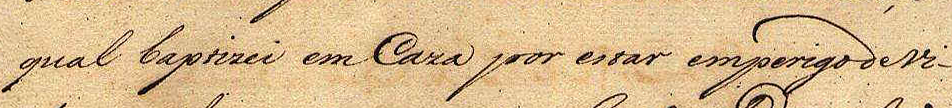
qual baptizei em Caza por estar em perigo de vi
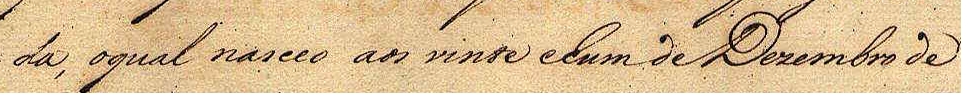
da, o qual nasceo aos vinte e hum de Dezembro de
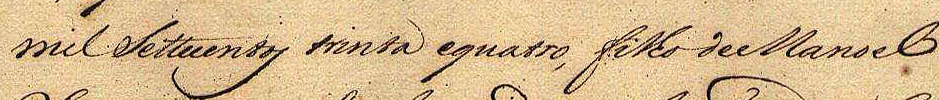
mil Settecentos trinta e quatro, filho de Manoel
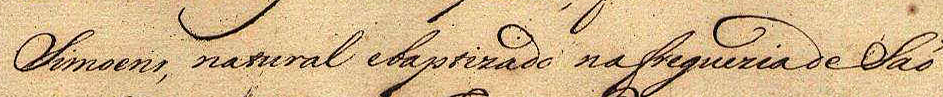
Simoens, natural e baptizado na freguezia de Saõ
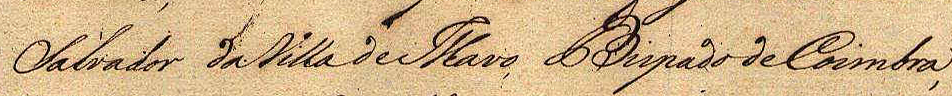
Salvador da Villa de Ilhavo, Bispado de Coimbra,
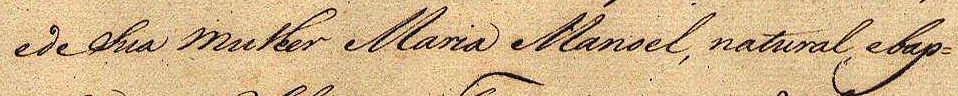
e de Sua mulher Maria Manoel, natural, e bap
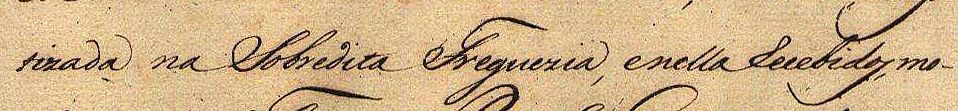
tizado na Sobredita Freguezia, e nella Recebidos, mo
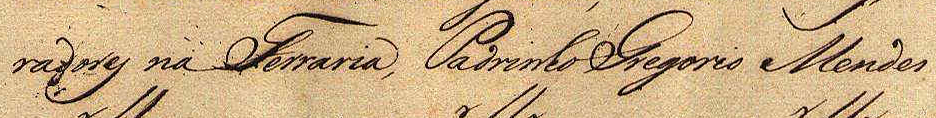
radores na Ferraria, Padrinho Gregorio Mendes
